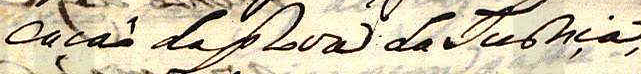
caçaõ da pRova da Iustiça,
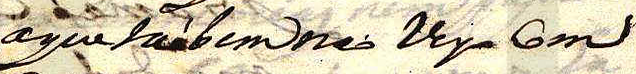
a que taõbem naõ Veyo com
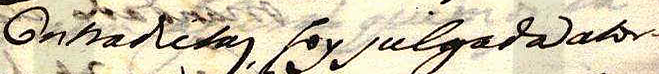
Contraditas, foy julgada a tor
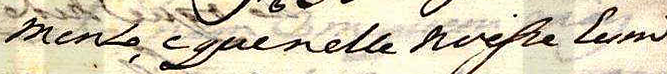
mento, e que nelle tivesse hum
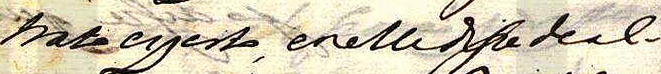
trato esperto, e nelle disse de al
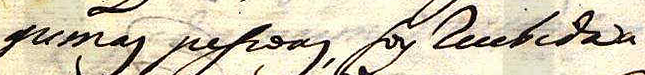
gumas pessoas, foy Recebida a
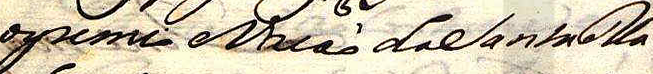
o gremio e Vniaõ da santa Ma
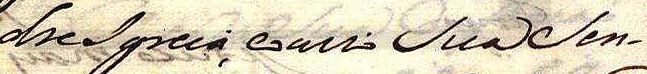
dre Igreia e ouvio sua sen
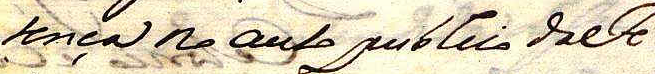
tença no auto publico da Fé
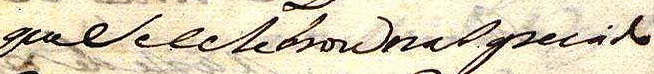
que se celebrou na Igreia do
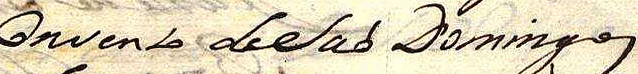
Convento de Saõ Domingos
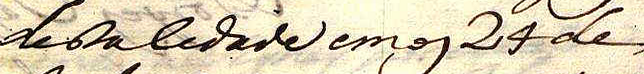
desta Cidade em os 24 de
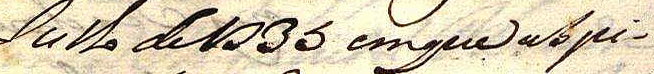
Iulho de 1735 em que abju
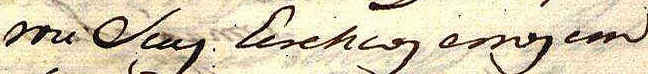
rou seus hereticos erros em
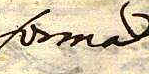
forma
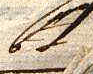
A
